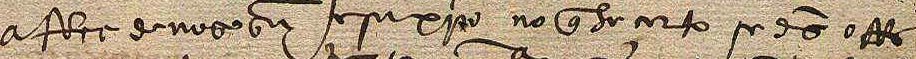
a ffee de noso s̄or Jesu xp̄o no q̄ he çerto se ds̄ offē
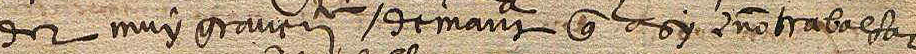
der muy grauemte / de manra q̄ asy ē n̄o trabalhar
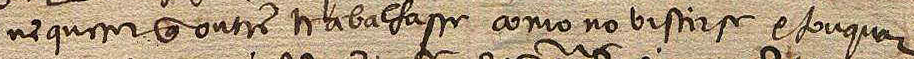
nē querer q̄ outrē trabalhasse como no vistirse e touquar
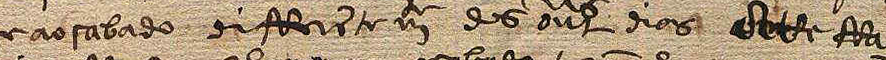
se ao sabado differētemte dos outros dias A Re ffa
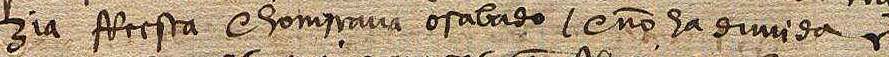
zia ffeesta e homrraua o sabado / e n̄o ha duujda ē
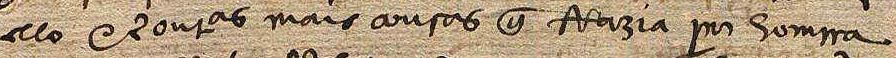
ello e ē outas mais cousas q̄ ffazia por homrra
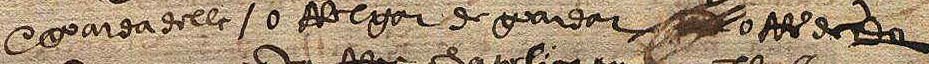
e goarda delle / o ffolgar de goardar __ offēdēdo
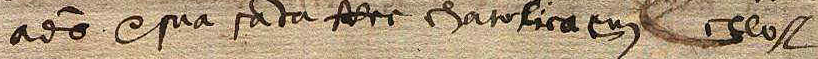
a ds̄ e sua sāta ffee chatolica em ello //
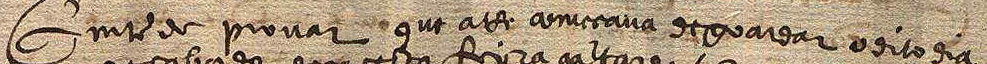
Emten̄de prouar que a Re começaua de goardar o dito dia
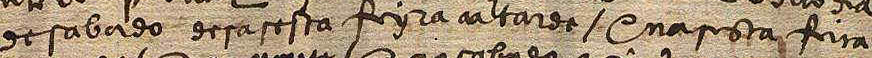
de sabado des a sesta feyra aa tarde / e na sesta feira
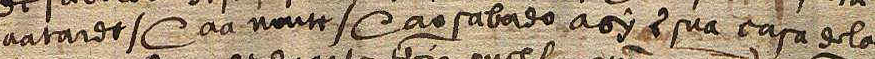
aa tarde / e aa noute / e ao sabado asy ē sua casa dela
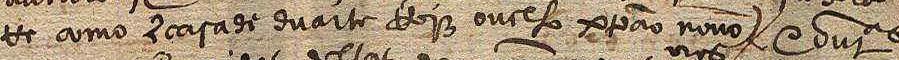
Re como ē casa de duarte Rōjz o uelho xpão nouo / e outras
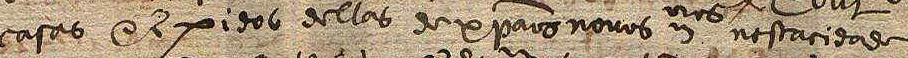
casas e ēxidos dellas de xpãos nouos mores nesta çidade
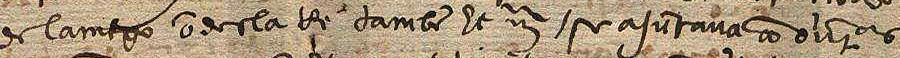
de lamego ōde ela Re tambē he mor / se aJūtaua c̄o outras
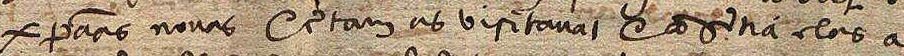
xpāas nouas e ētam as visitaua / e c̄osētia elas a
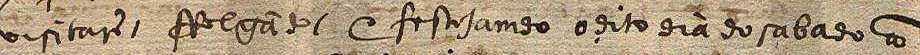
visitarē / ffolgādo / e festejamdo o dito doa do sabado cō
